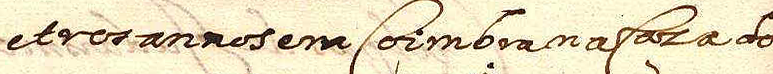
e tres annos em Coimbra na Caza do
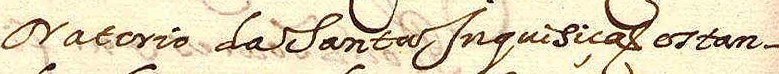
Oratorio da Santa Jnquisição estan
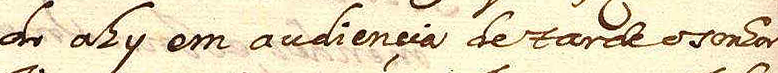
do ahy em audiençia de tarde o senhor
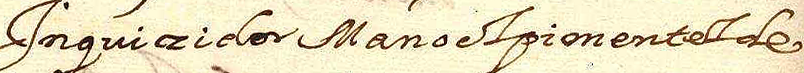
Jnquizidor Manoel pimenteL de
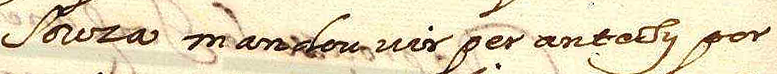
Souza mandou uir perante sy por
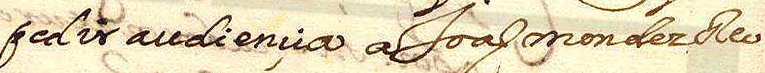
pedir audiençia a João mendez Reo
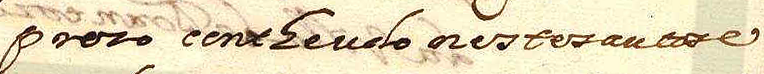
prezo contheudo nestes autos e
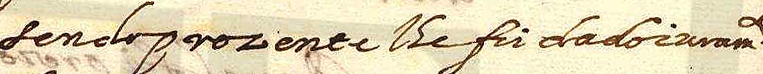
sendo prezente lhe foi dado iuramto
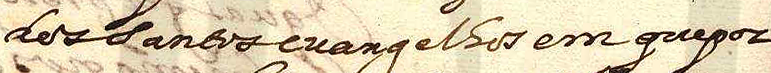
dos santos euangelhos em que pos
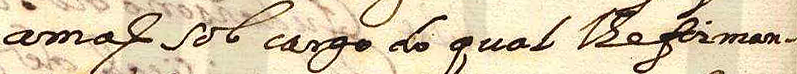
a maõ sob cargo do qual lhe foi man
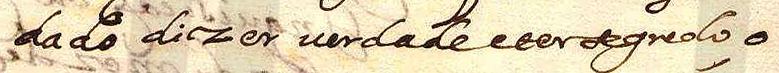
dado dizer uerdade e ter segredo, o
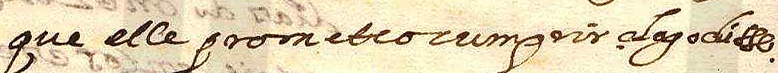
que elle prometeo cumprir e logo disse.
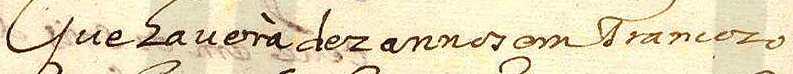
Que hauerà dez annos em Trancozo
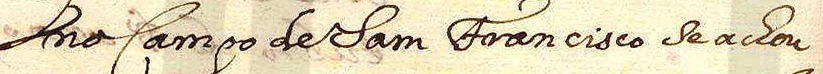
no Campo de Sam Francisco se achou
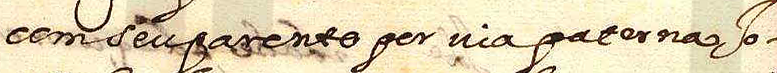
com seu parente per uia parterna Jo
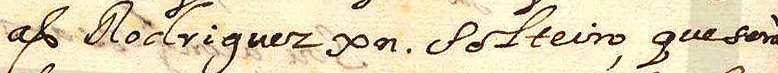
aõ Rodriguez xn. solteiro, que serà
